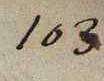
103
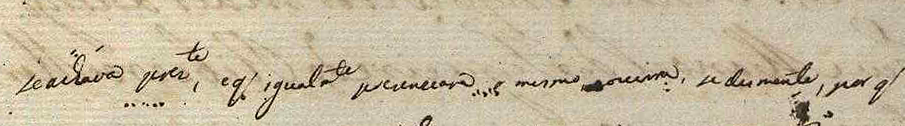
se achava prez.te, e q̄ igualmte prezenceara e mesmo ouvira, se desmente, por q̄
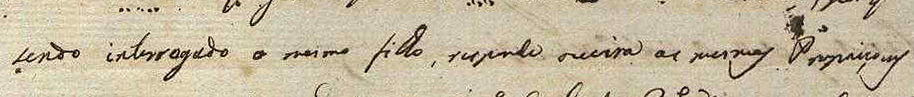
sendo interrogado o mesmo filho, responde ouvira as mesmas Propoziçoens
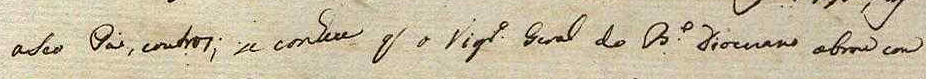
a seo Pai, e outros; se conhece q̄ o Vigr.o Geral do B.o Diocezano obrou com
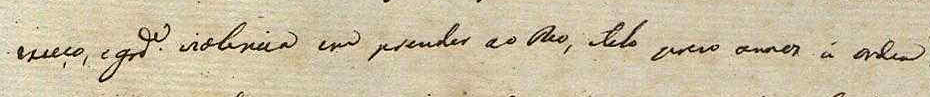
exceço, e grd.e violencia em prender ao Reo, e telo prezo annos á ordem
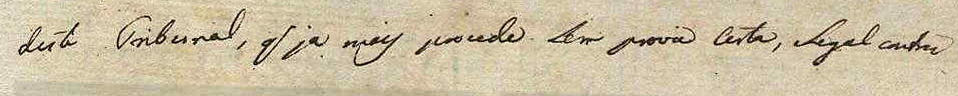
deste Tribunal, q̄ jamais procede sem prova certa, e Legal contra
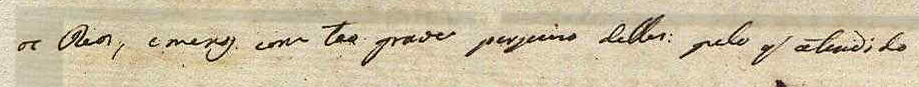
os Reos, e menos com tao grave perjuizo delles: pelo q̄ atendido
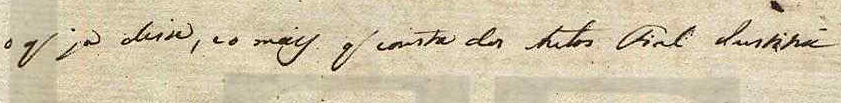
o q̄ ja disse, e o mais q̄ consta dos Autos Fiat Iustitia
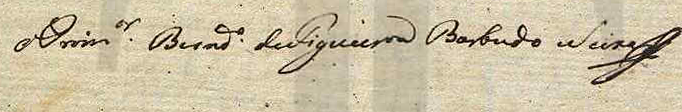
o Prom.or Bernd.o de Figueiroa Barbudo e Seixa
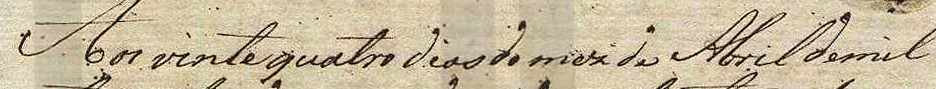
Aos vinte quatro dias do mez de Abril de mil
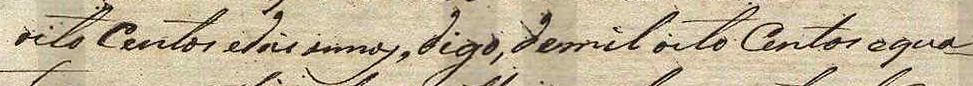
oitocentos e dois annos, digo, de mil oitoCentos e qua
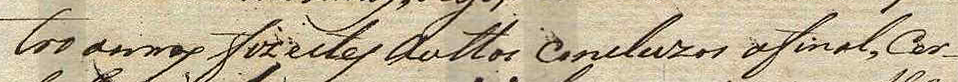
tro annos fiz estes auttos concluzos afinal, cer
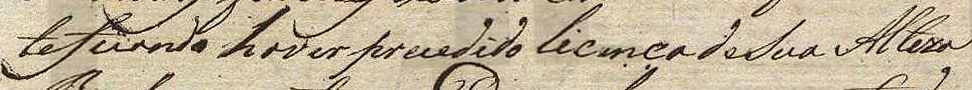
teficando haver precedido licença de Sua Alteza
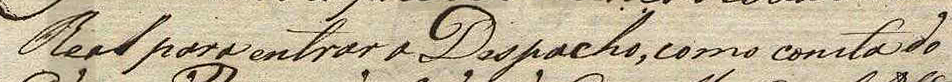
Real para entrar o Despacho, como consta do
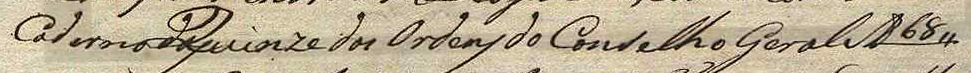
Caderno da quinze das Ordens do Conselho Geral f 68
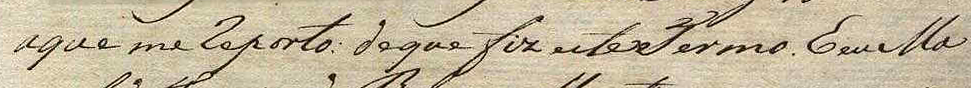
a que me Reporto de que fiz este Termo. E eu Ma
